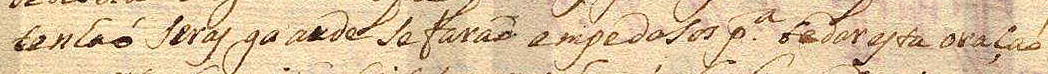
tenhaõ seras gaarde se faraõ em pedasos p.a te dar esta oraçaõ
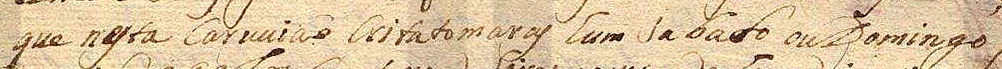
que nesta Caruuiaõ Crita tomaras hum sabado ou Domingo
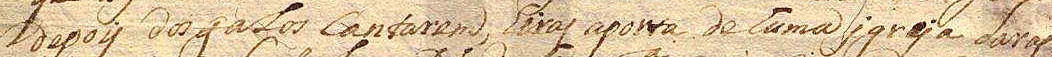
depois dos galos Cantarem, hiras a porta de huma jgreja daras
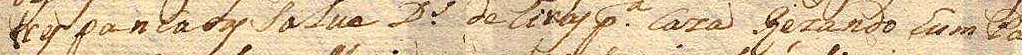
tres pancadas Salue D.s de hiras p.a caza Rezando hum Pa
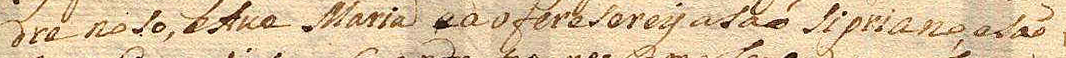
dre noso, e Aue Maria, e a oferesereis a saõ sipriano, e saõ
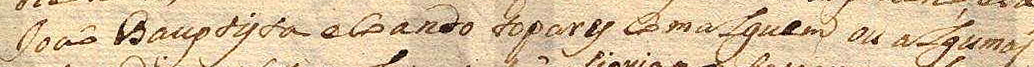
Joaõ Bauptista e Coando topares Com alguem, ou algumas
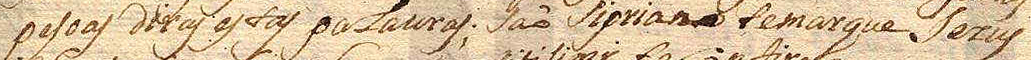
pesoas diras estas palauras; saõ Sipriano te marque Jezus
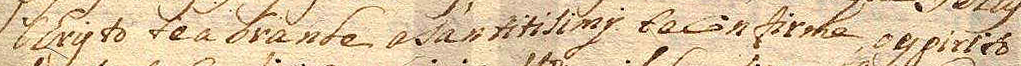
Christo se abrande a santitisimy te confirme, o espirito
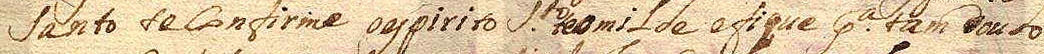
Santo te Confirme o espirito S.to te omilde e fique p.a tam doudo
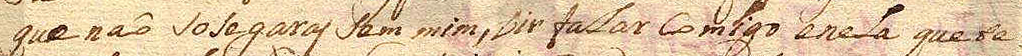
que naõ sosegaras sem mim, vir faLar Comigo e nela que te
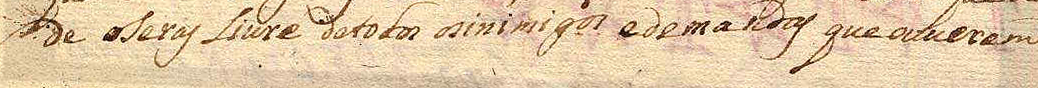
de e seras Liure de todos os inimigos e demandas que ouuerem
